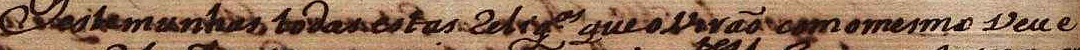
Testemunhas todas estas Religas que o Viraõ com o mesmo veu e
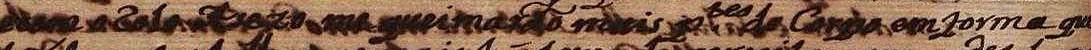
com o Rolo Prezo me queimaraõ mais p.tes do Corpo em forma que
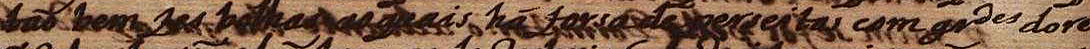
taõbem fes bolhas ao quais há forsa de perseitas com grdes dores
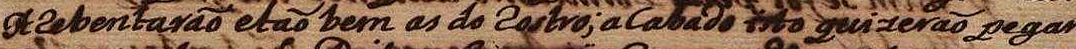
ARebentarão e taõbem as do Rostro; aCabado isto quizeraõ pegar
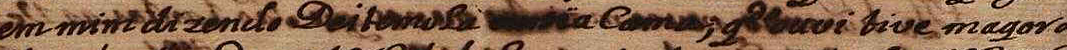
em mim dizendo DeitamoLa _ na Cama; qdo ouvi tive magora
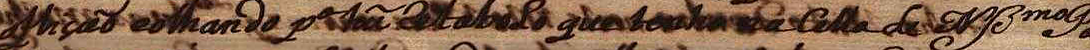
afliçaõ e olhando p.a hū RetaboLo que tenho na Cella de N SSmo Pa
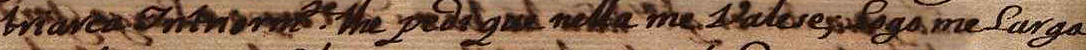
triarca Intriorm.te lhe pedi que nella me Valese; Logo me Larga
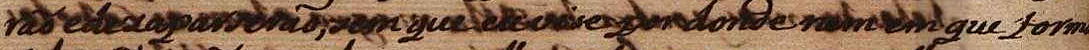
raõ e dezaparseraõ, sem que eu vise por donde nem em que forma
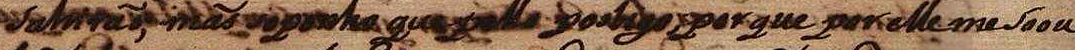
sahiraõ, mãs sopunha que pello postigo, porque por elle me soou
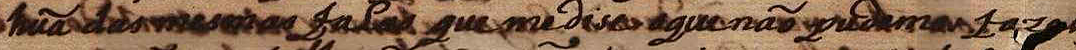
hūa das mesmas faLas que me dise o que naõ pudemos fazer
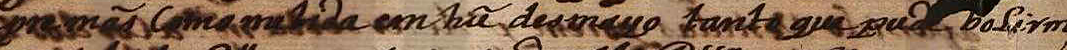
pre mãs como metida em hū desmayo tanto que pude boLirme
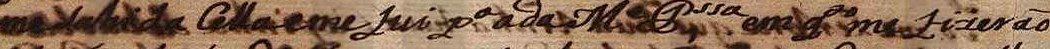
me sahi da Cella e me fui pa a da M.e P,ssa emqto me fizeraõ
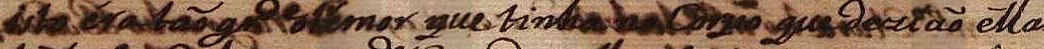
isto éra taõ grde o temor que tinha no Corpo que deziaõ ellas
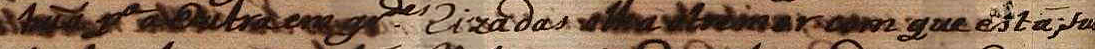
hūa pa a Outra em gr.des Rizadas olha o tremor com que está; sus
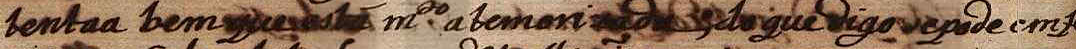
tentaa bem que está m.to atemorizada, do que digo se pode emfe
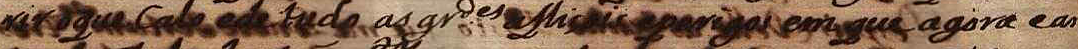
rir o que Calo e de tudo as gr.des afliçois e perigos em que agora e an
